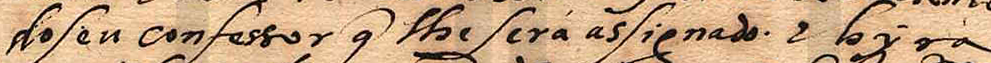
do seu confessor q̄ lhe será assignado. E hyra
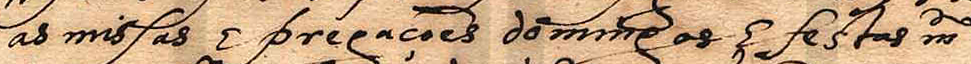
as missas E pregações domingos E festas mto
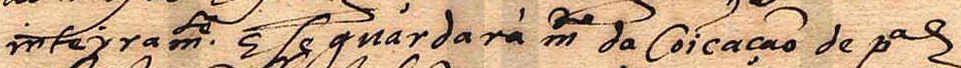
inteyramte. E se guardará mto da Coicação de pas
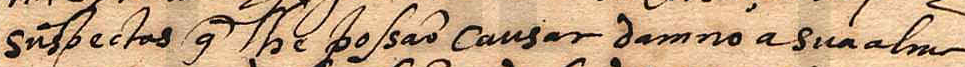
suspectas q̄ lhe possão causar damno a sua alma
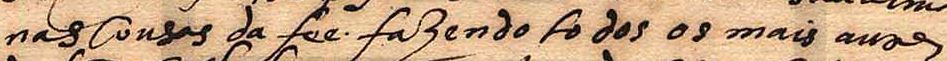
nas cousas da fee. fazendo todos os mais autos
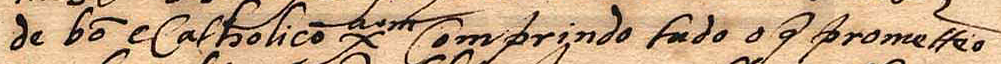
de bō e Catholico xaom Comprindo tudo o q̄ prometteo
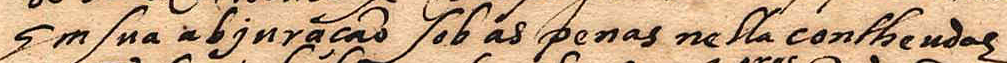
Em sua abjuração sob as penas nella contheudas
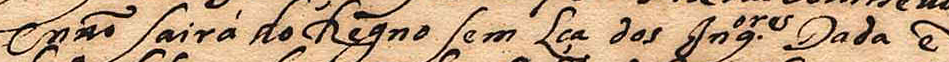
e não sairá do Regno sem Lça dos Jnq.ores Dada ē
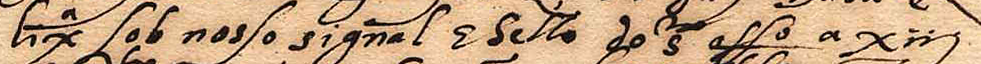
lixa sob nosso signal E sello do sto offo a xiij
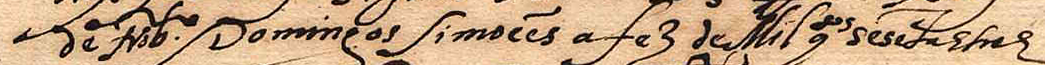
de N̄ob.ro Domingos Simoeẽs a fez de Mil qtos sēseta E tres
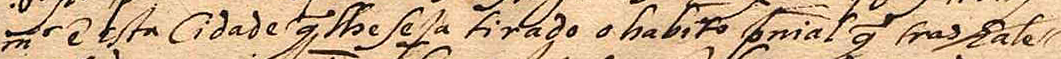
mor ē esta Cidade q̄ lhe seJa tirado o habito p̄nial q̄ tras E ale
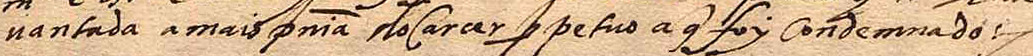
uantada a mais pn̄ia do Carcer ꝑpetuo a q̄ foy condemnado
